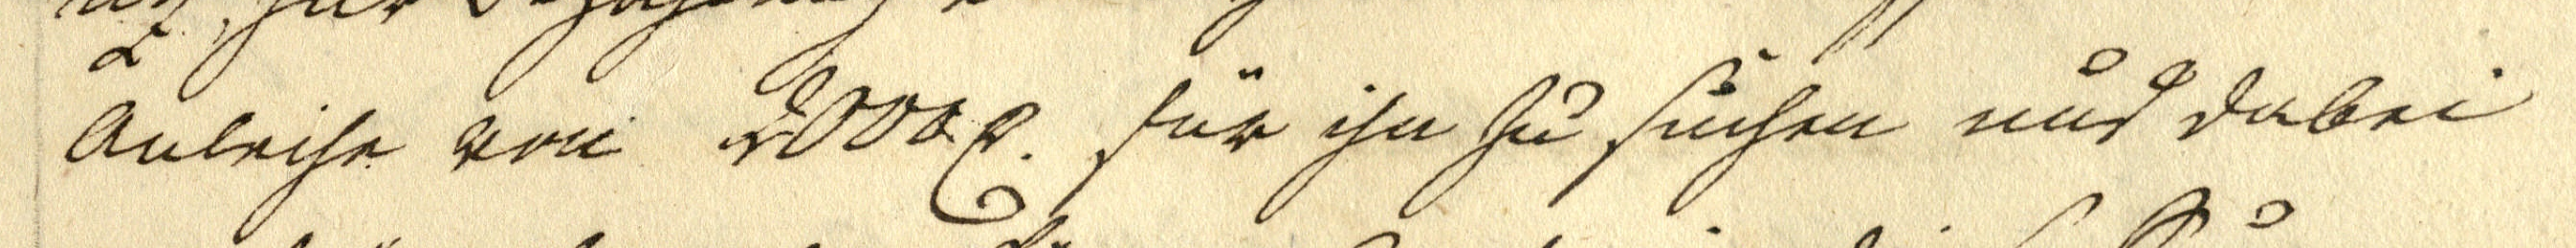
Anleihe von 2000rtl. für ihn zu suchen und dabei
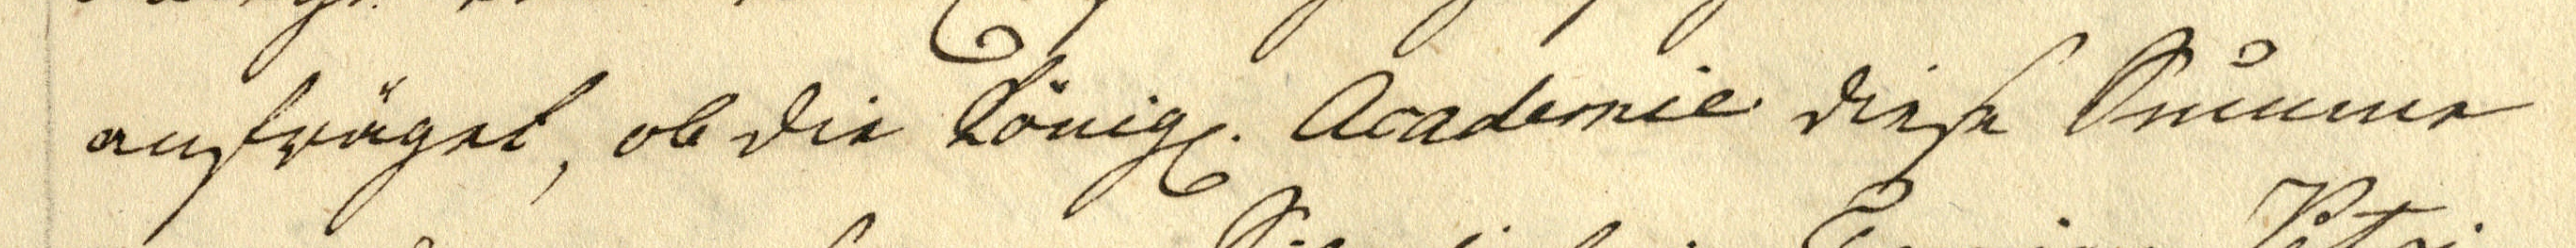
anfräget, ob die Königl. Academie diese Summe
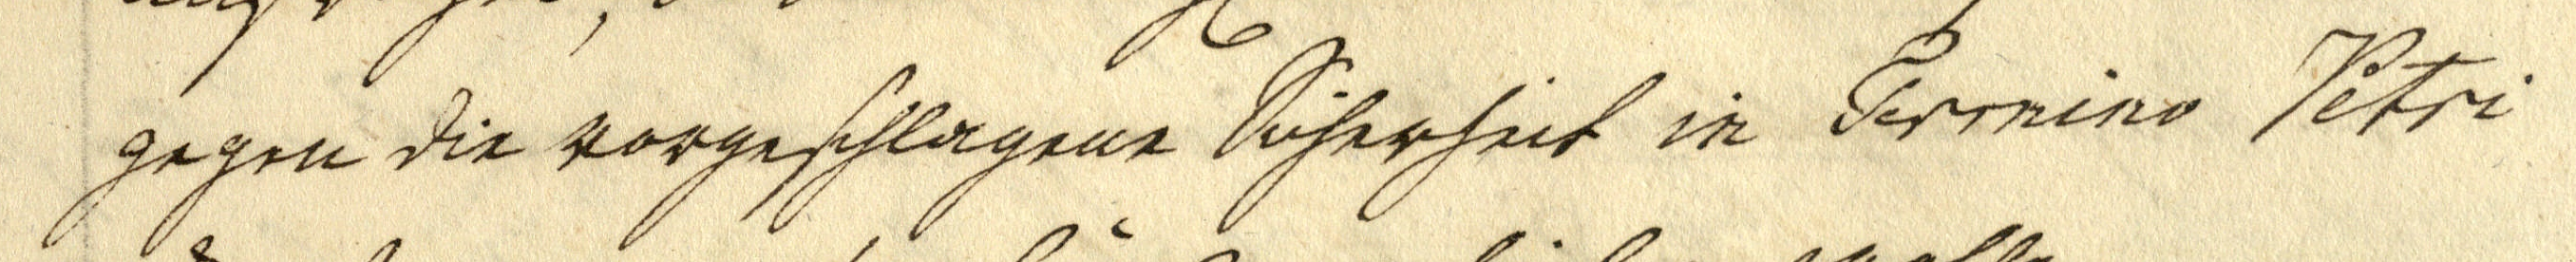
gegen die vorgeschlagene Sicherheit in Termino Petri
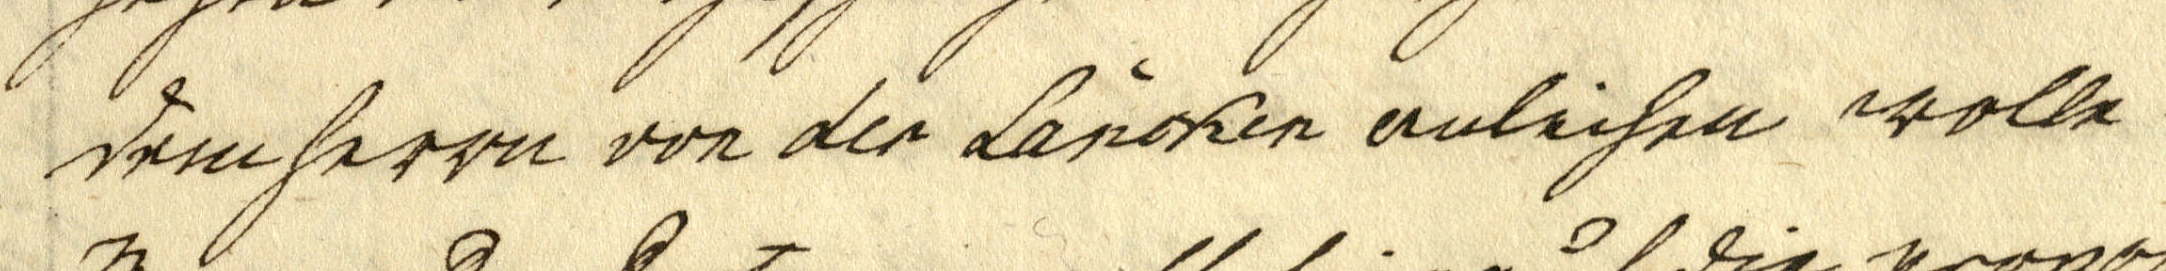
dem Herrn von der Lancken anleihen wolle.
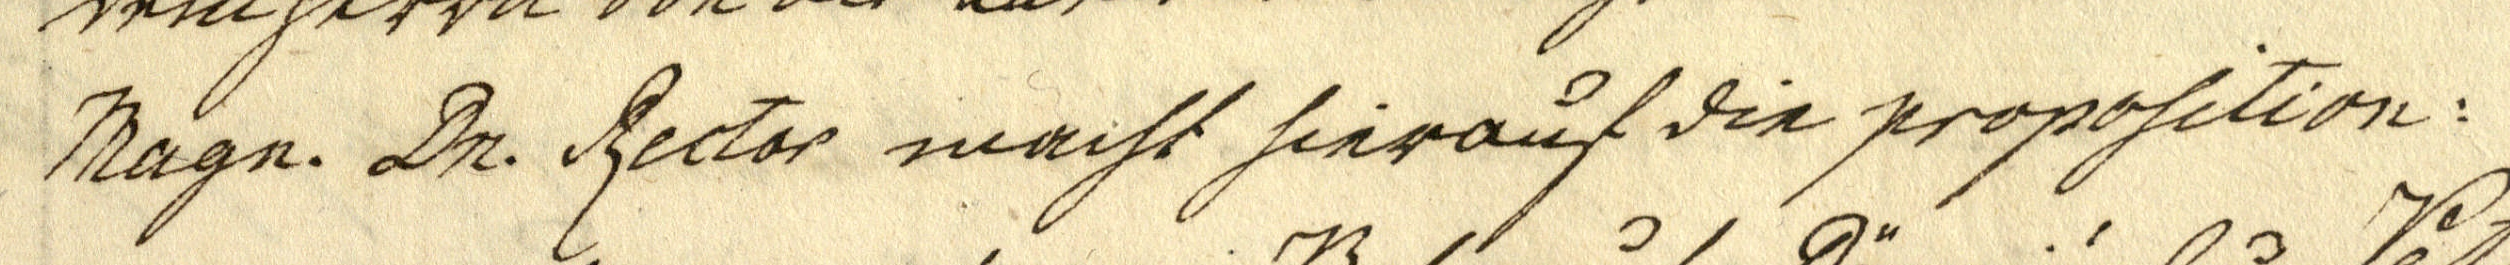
Magn. Dn. Rector macht hierauf die proposition:
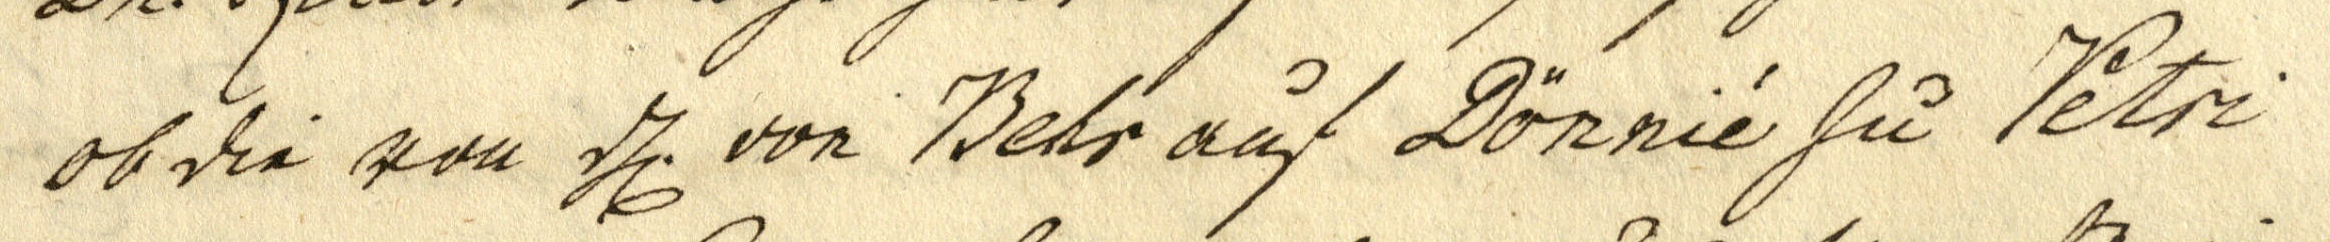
ob die von dh. von Behr auf Dönnie zu Petri
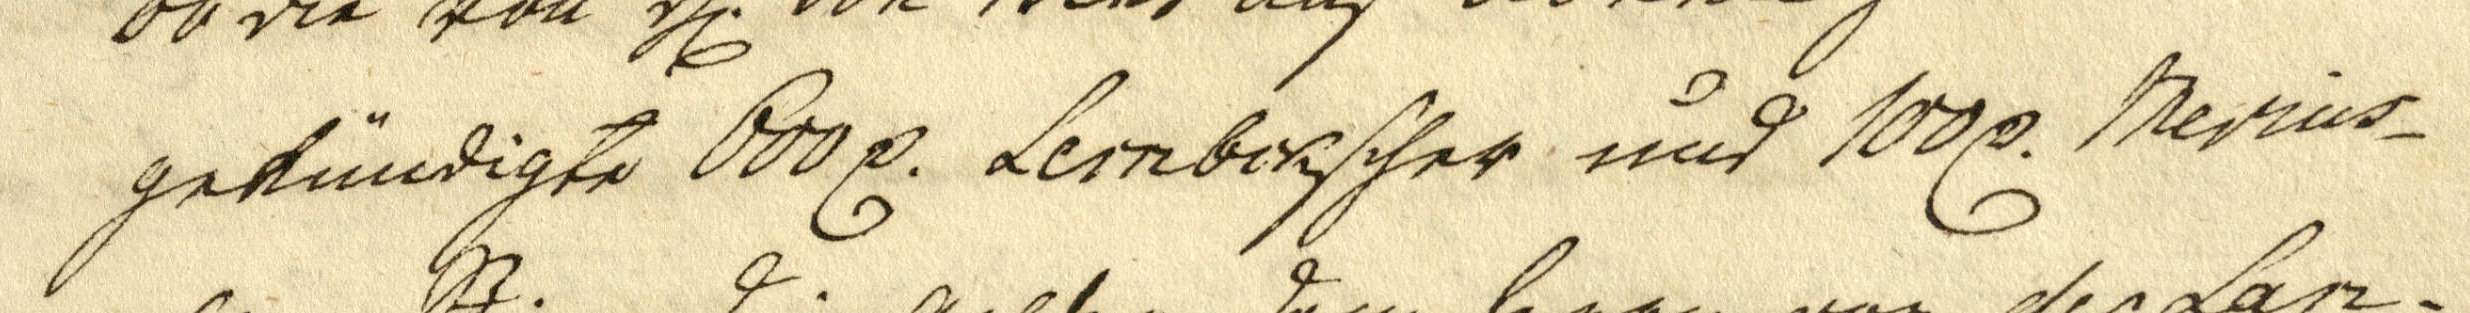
gekündigte 600 rtl. Lembckscher und 100rtl Mevius-
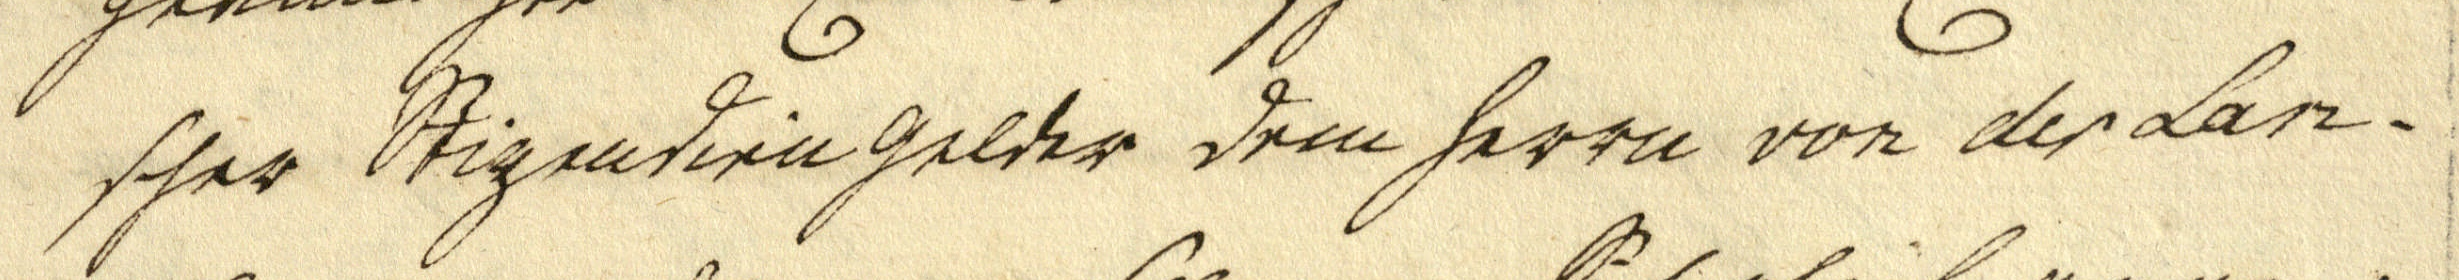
scher Stipendiengelder dem Herrn von der Lan-
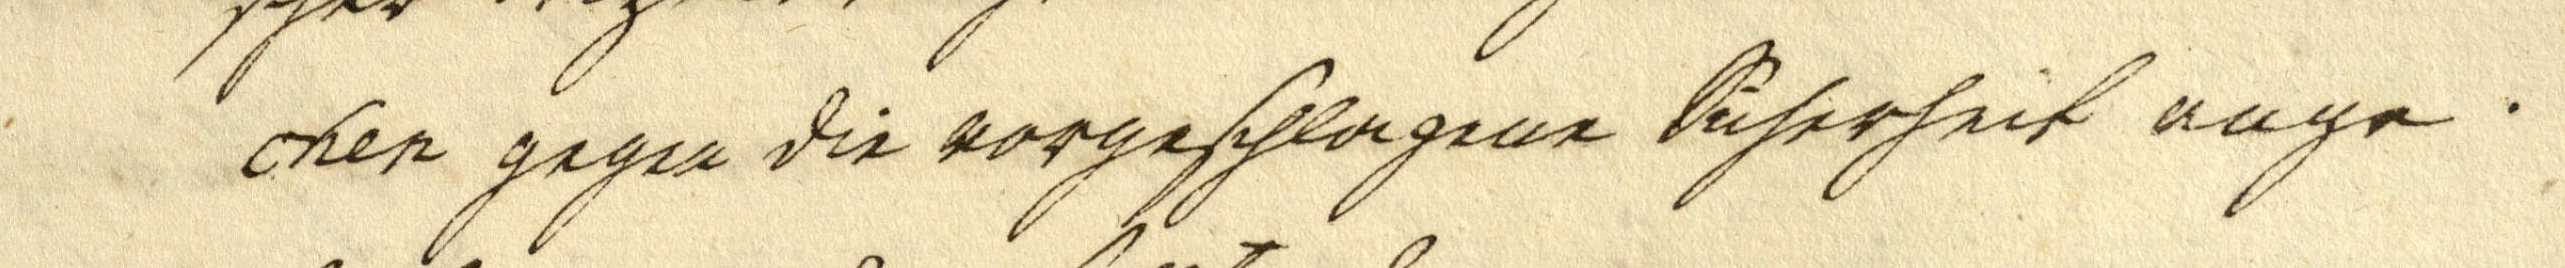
cken gegen die vorgeschlagene Sicherheit ange-
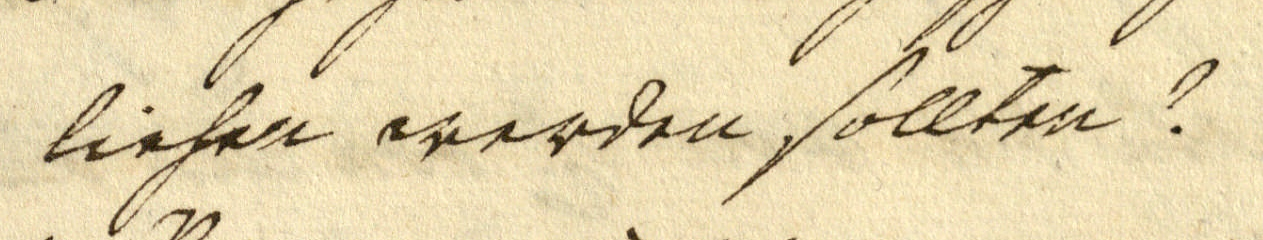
liehen werden sollten?
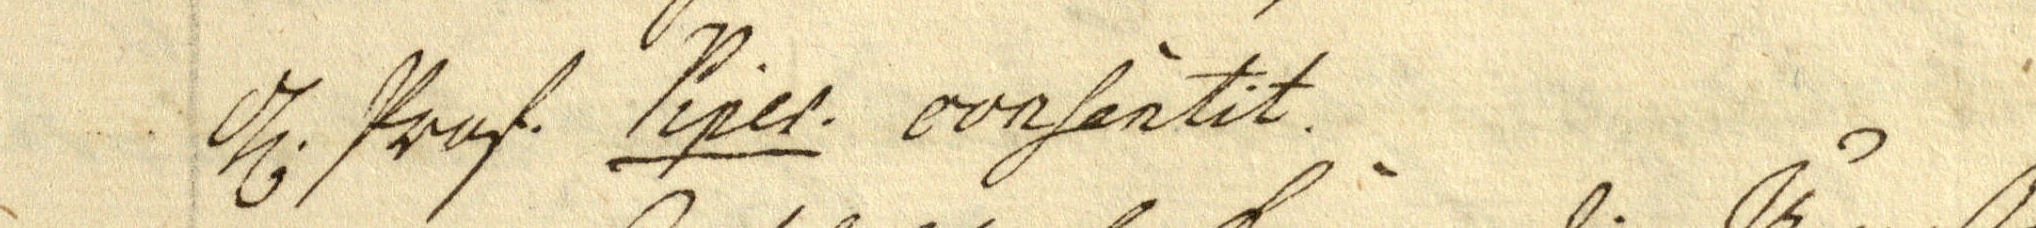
dh. Prof. Piper. consentit.
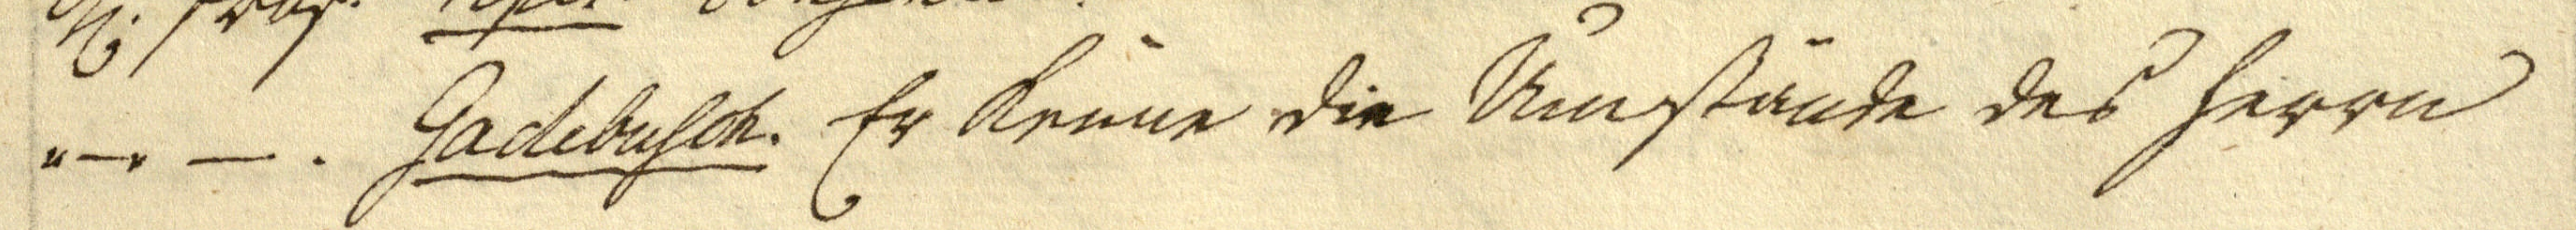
" - " - " Gadebusch. Er kenne die Umstände des Herrn
